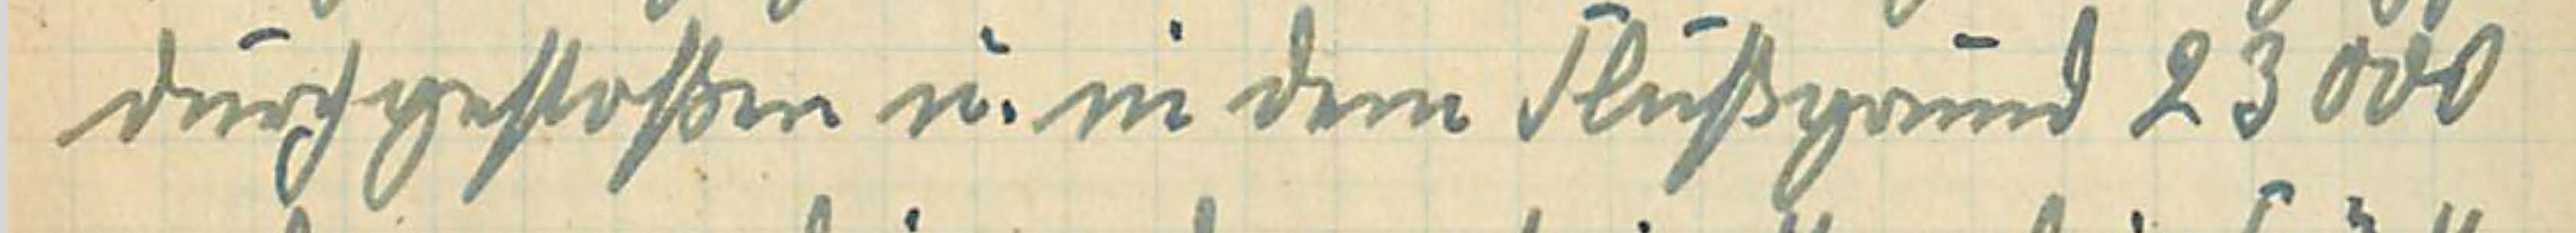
durchgestoßen u. in dem Flußgrund 23 000
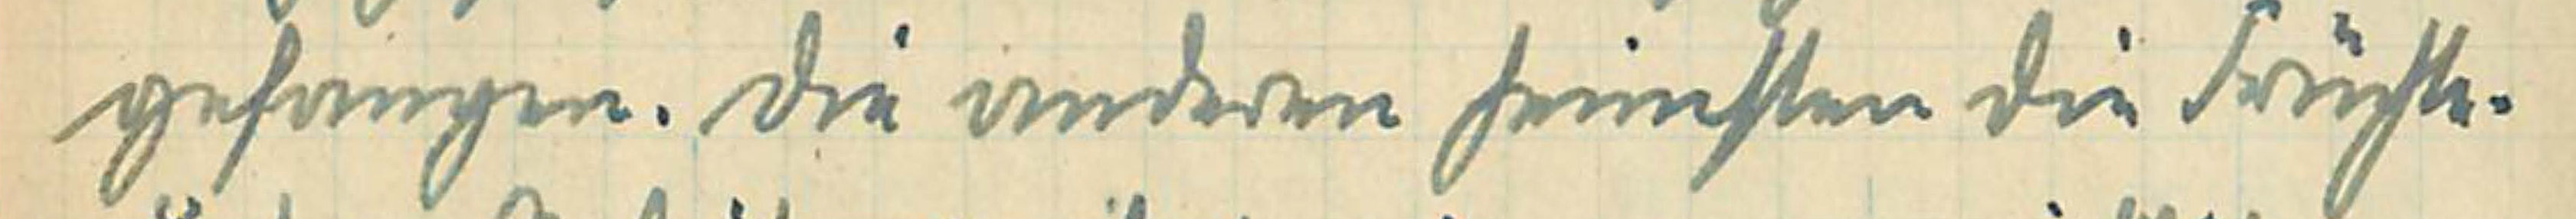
gefangen. Die anderen heimsten die Früchte
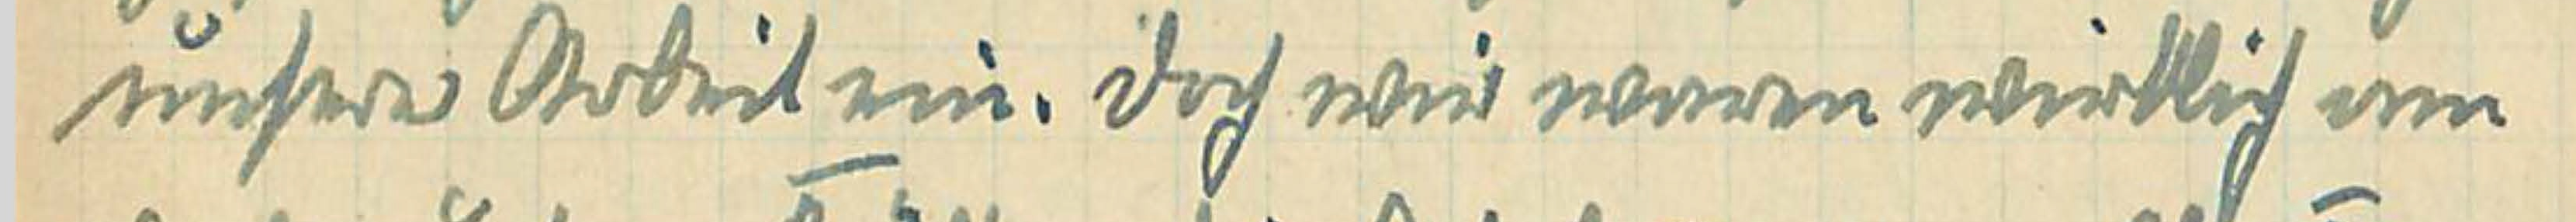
unserer Arbeit ein. Doch wir waren wirklich am
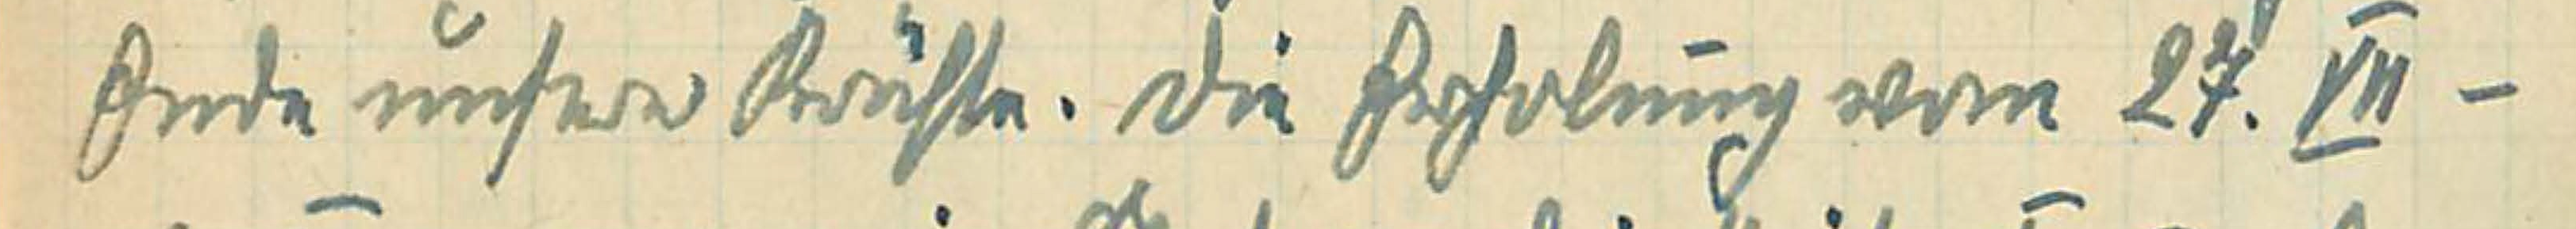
Ende unserer Kräfte. Die Erholung vom 27. VII –
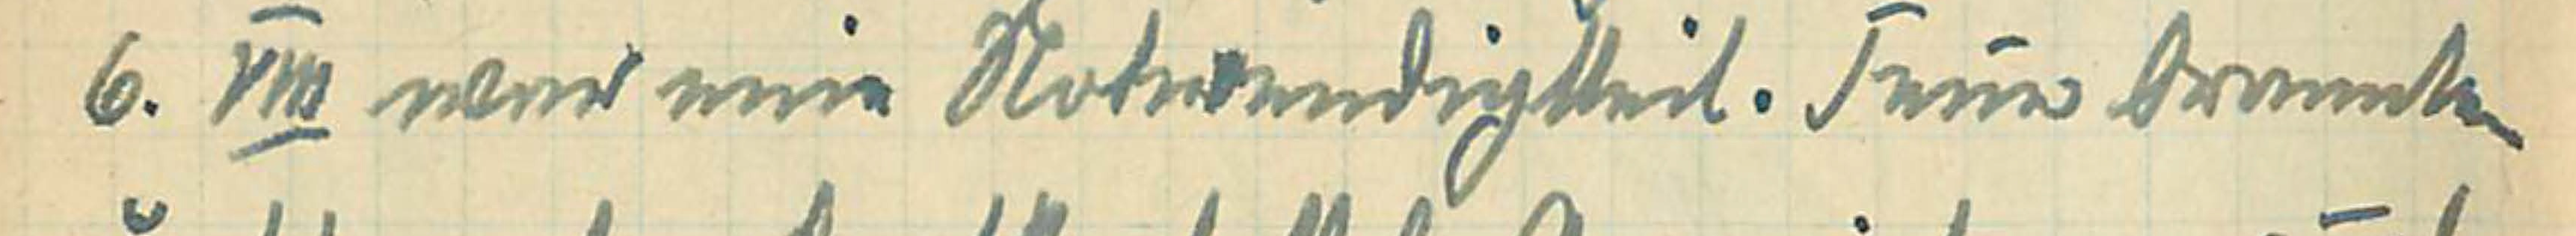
6. VIII war eine Notwendigkeit. Feuer brannten
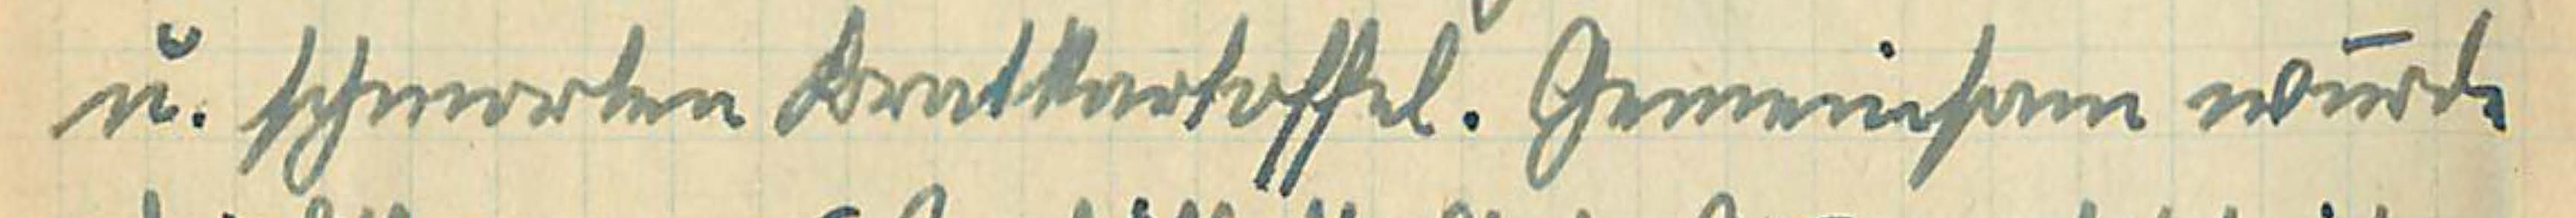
u. schmorten Bratkartoffel. Gemeinsam wurde
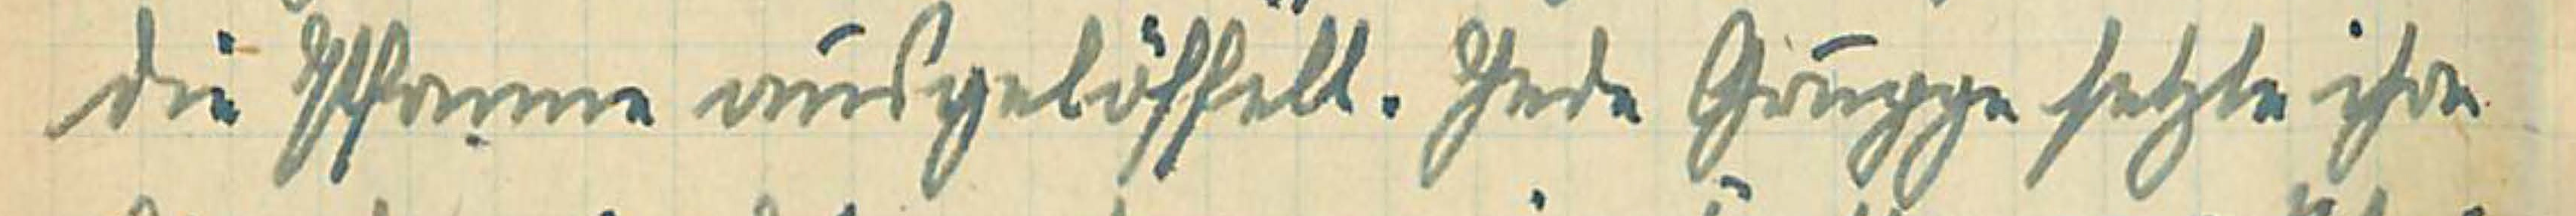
die Pfanne ausgelöffelt. Jede Gruppe setzte ihre
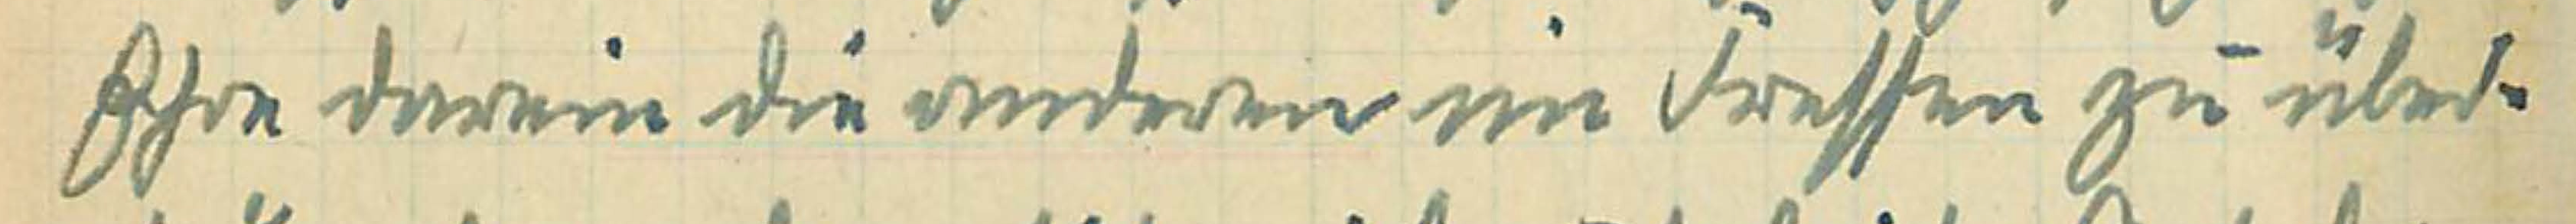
Ehre darein die anderen im Fressen zu über-
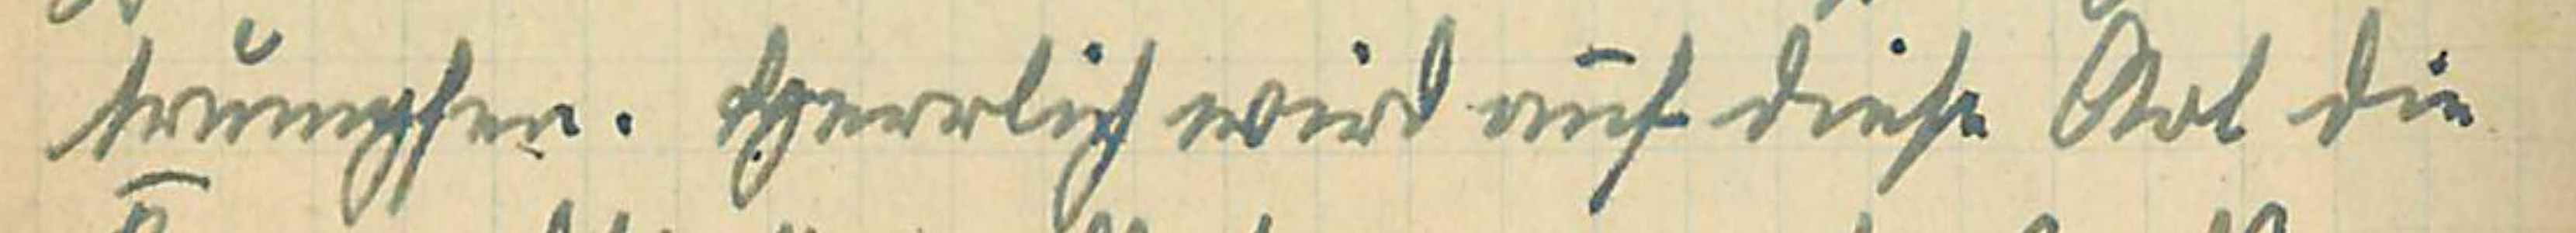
trumpfen. Herrlich wird auf diese Art die
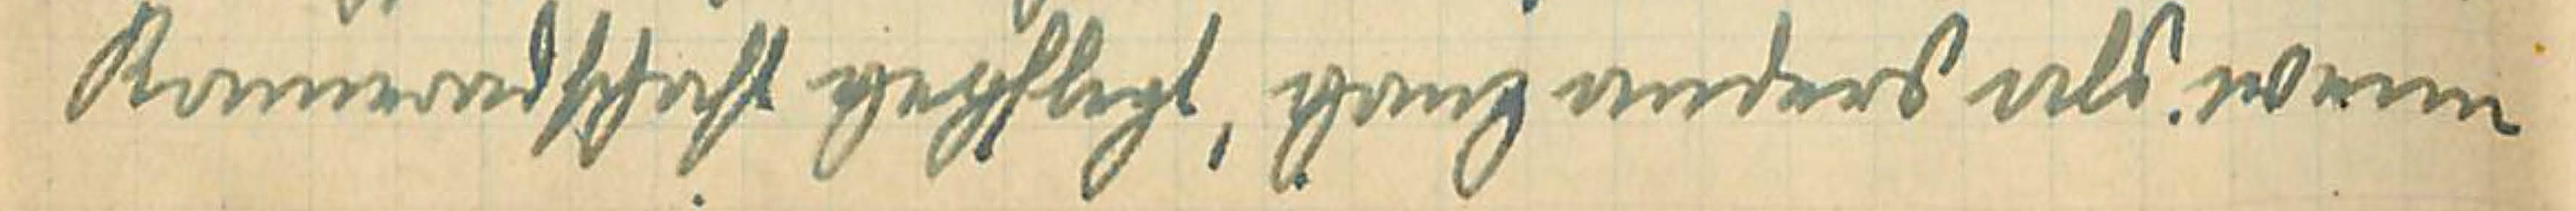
Kameradschaft gepflegt, ganz anders als. wenn
